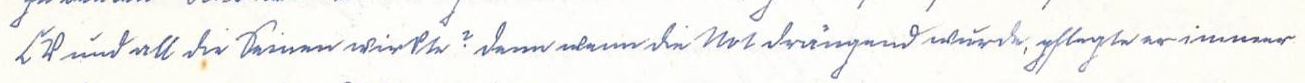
CV und all die Seinen wirkte? Denn wenn die Not drängend wurde, pflegte er immer
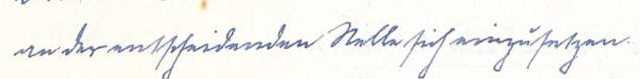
an der entscheidenden Stelle sich einzusetzen.
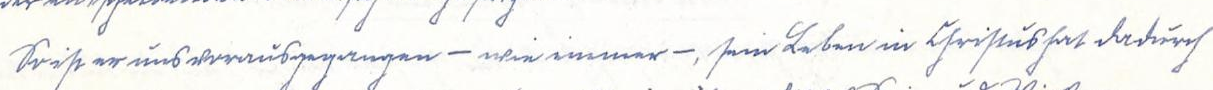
So ist er uns vorausgegangen -wie immer-, sein Leben in Christus hat dadurch
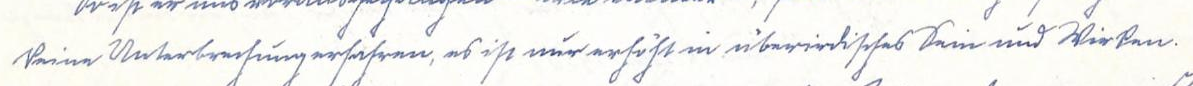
keine Unterbrechung erfahren, es ist nur erhöht in überirdisches Sein und Wirken.
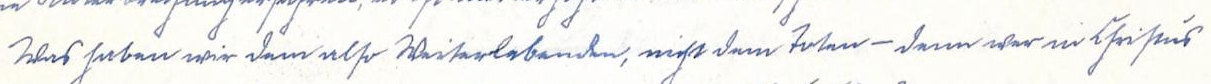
Was haben wir dem also Weiterlebenden, nicht dem Toten - denn wer in Christus
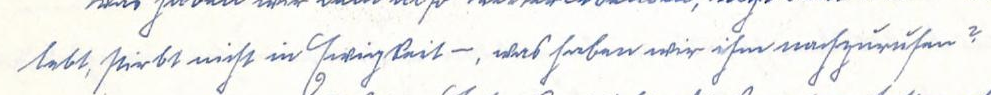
lebt, stirbt nicht in Ewigkeit -, was haben wir ihm nachzurufen?
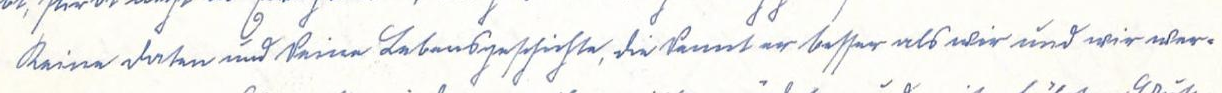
Keine Daten und keine Lebensgeschichte, die kennt er besser als wir und wir wer-
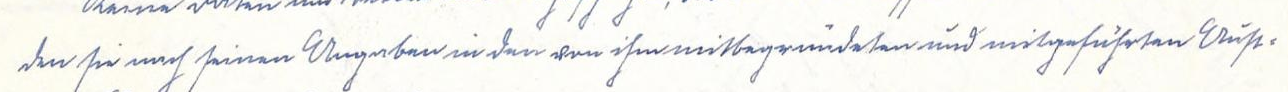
den sie nach seinen Angaben in den von ihm mitbegründeten und mitgeführten Aust-
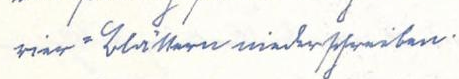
rier-Blättern niederschreiben.
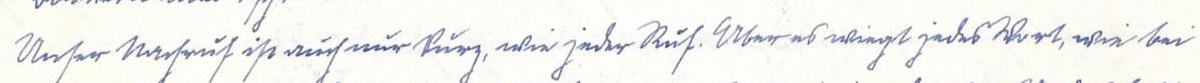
Unser Nachruf ist auch nur kurz, wie jeder Ruf. Aber es wiegt jedes Wort, wie bei
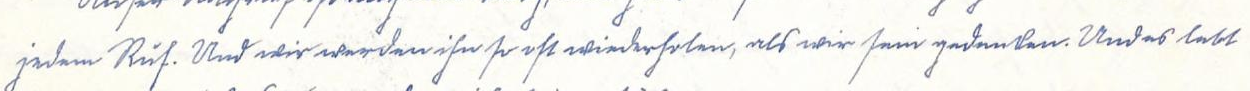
jedem Beruf. Und wir werden ihn so oft wiederholen, als wir sein gedenken. Und es lebt
